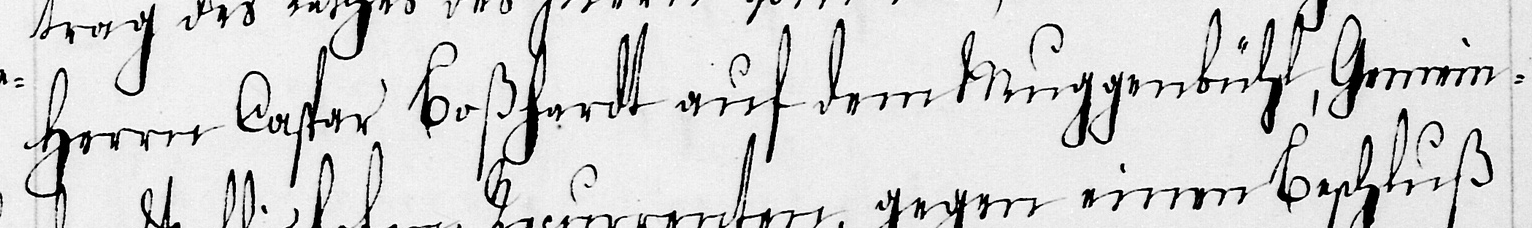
Herrn Caspar Boßhardt auf dem Muggenbühl, Gemein¬
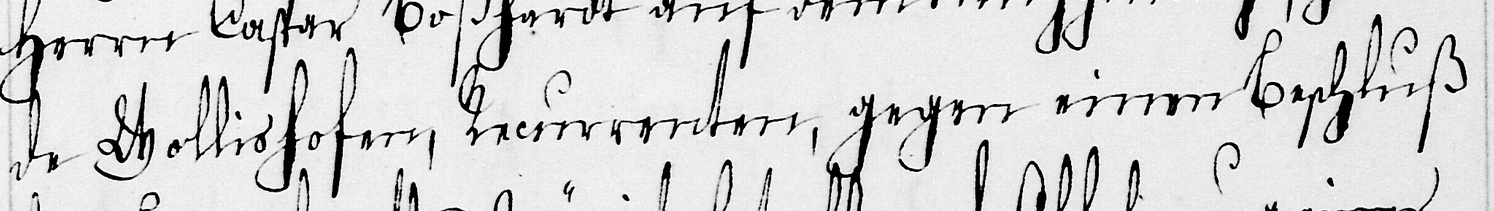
de Wollishofen, Recurrenten, gegen einen Beschluß
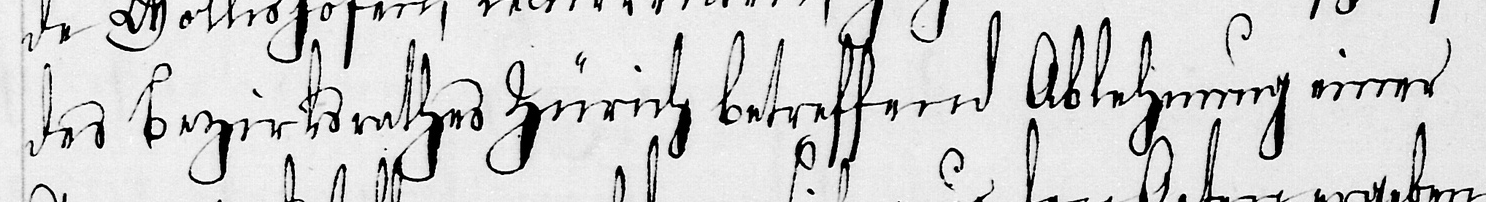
des Bezirksrathes Zürich betreffend Ablehnung einer
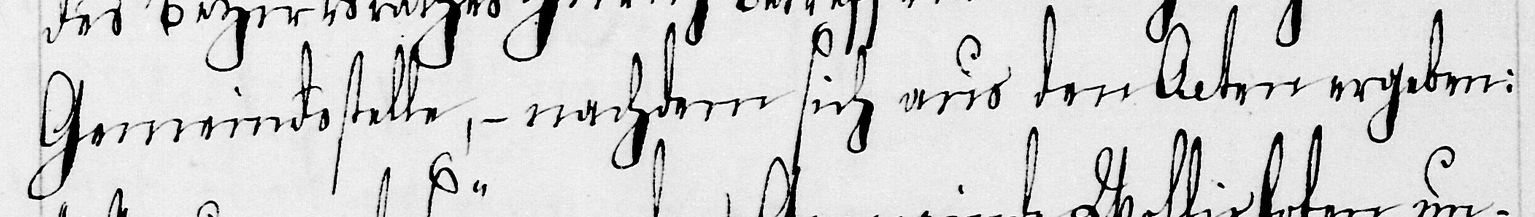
Gemeindstelle, – nachdem sich aus den Acten ergeben:
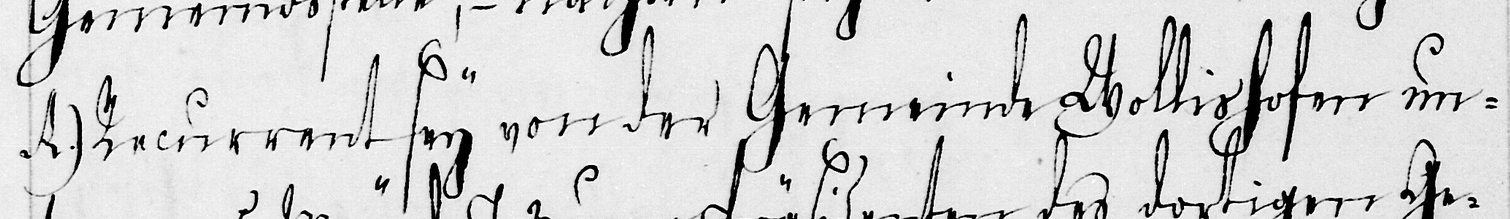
A.) Recurrent sey von der Gemeinde Wollishofen un¬
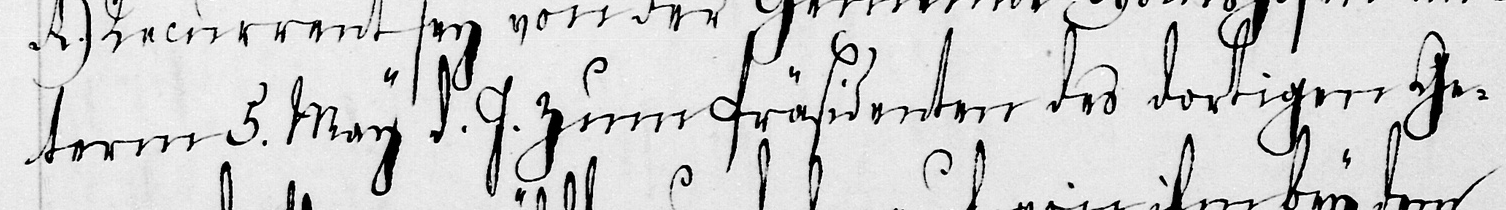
term 5. May d. J. zum Präsidenten des dortigen Ge¬
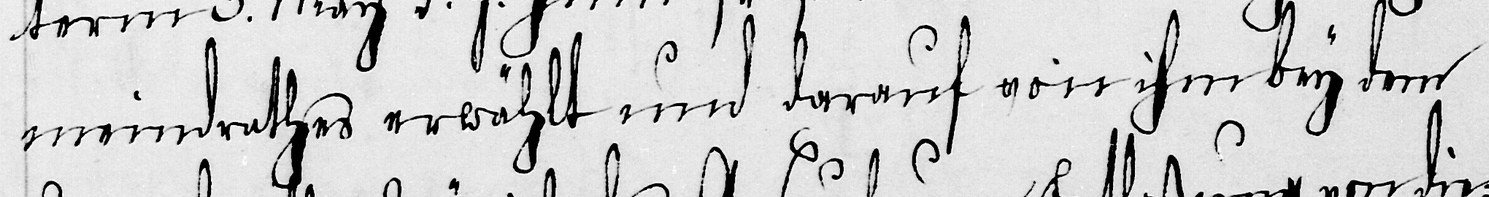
meindrathes erwählt und darauf von ihm bey dem
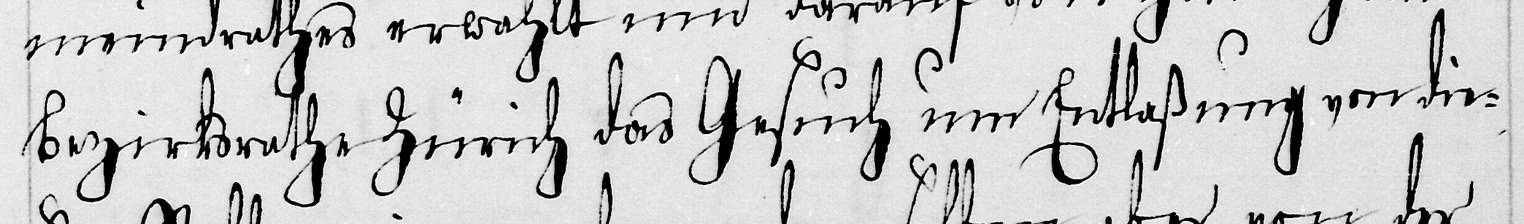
Bezirksrathe Zürich das Gesuch um Entlaßung von die¬
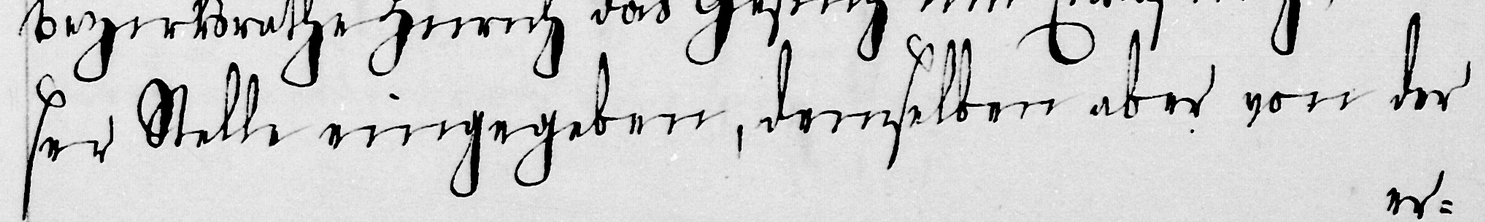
ser Stelle eingegeben, demselben aber von der
